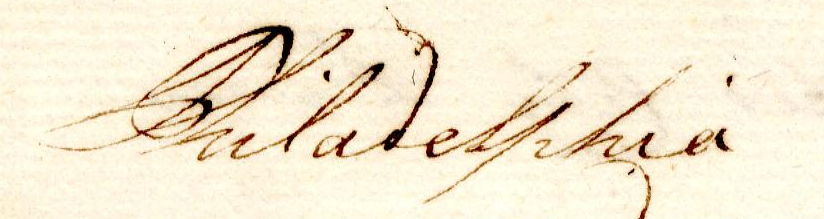Philadelphia
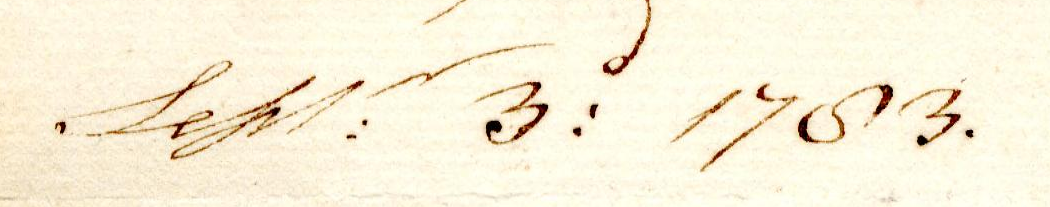Sept. 3^d: 1783.
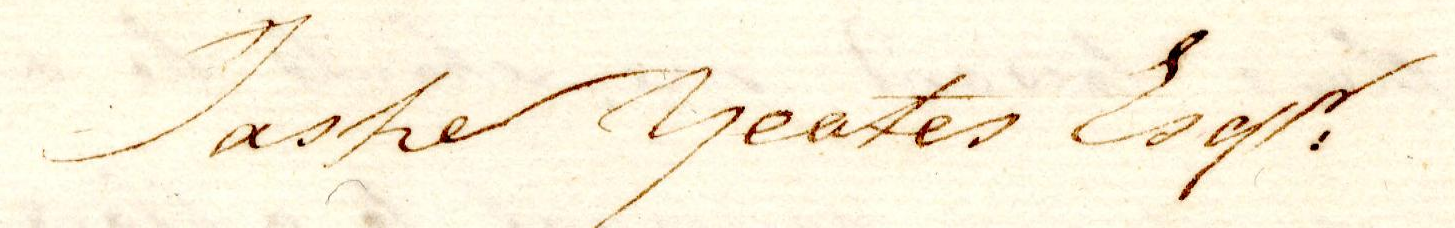Jasper Yeates Esq^r.
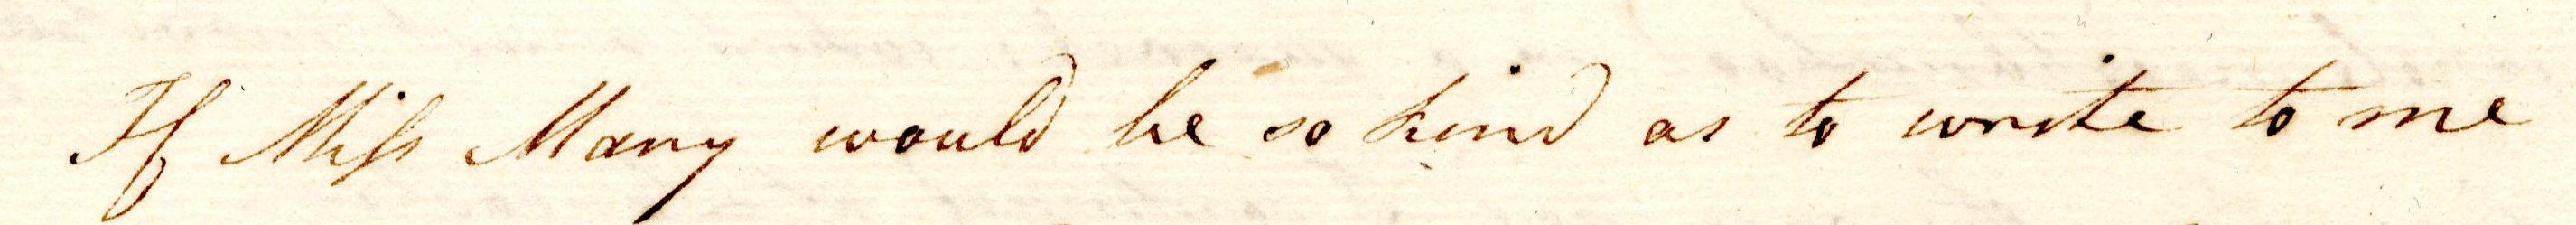If Miss Mary would be so kind as to write to me
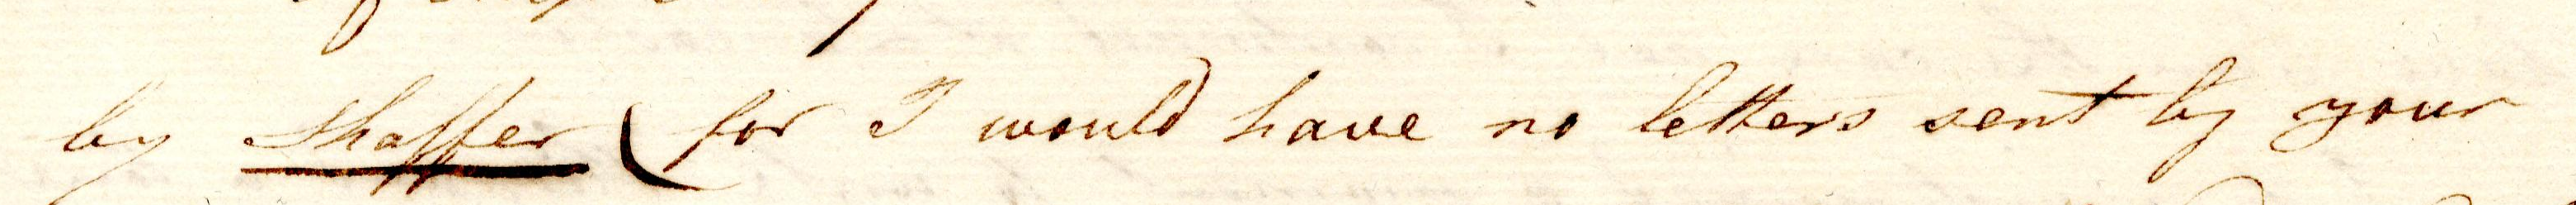by Shaffer (for I would have no letters sent by your
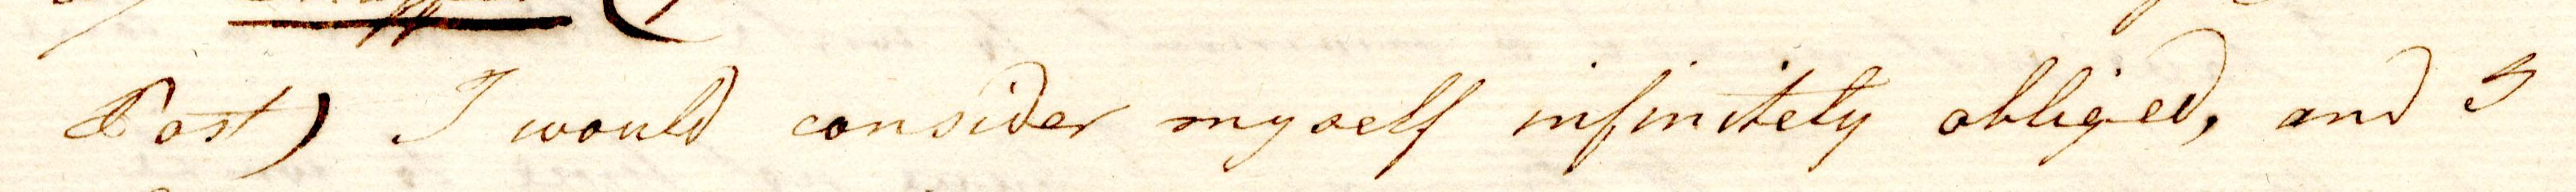Post) I would consider myself infinitely obliged, and I
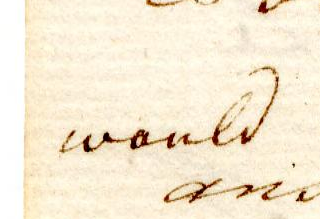would
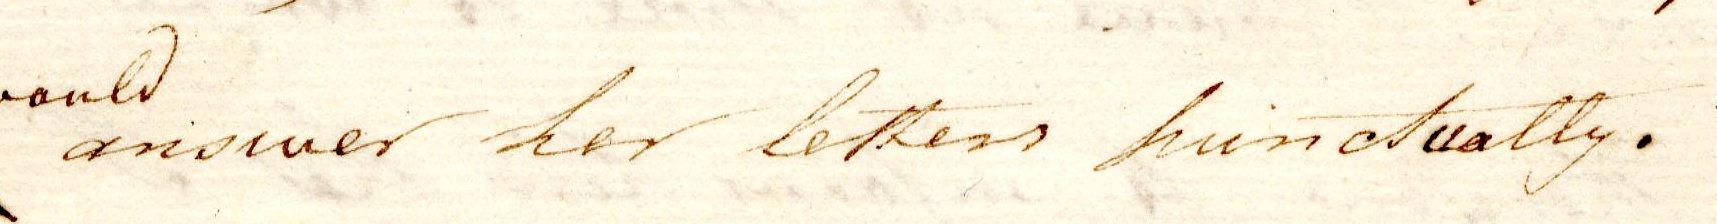answer her letters punctually.
